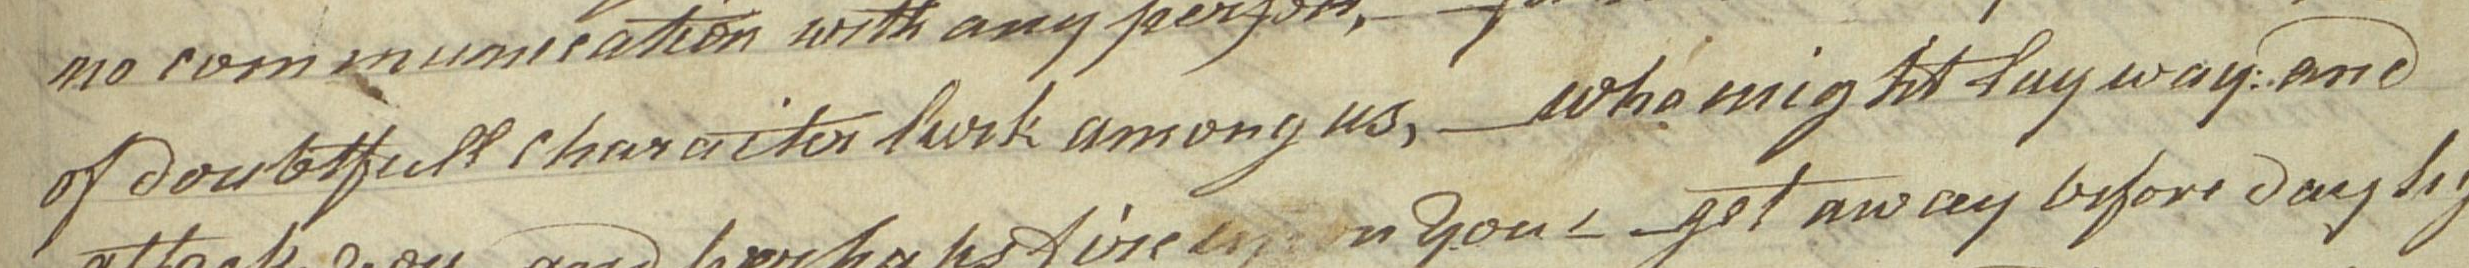of doubtfull character lurk among us, who might lay way and
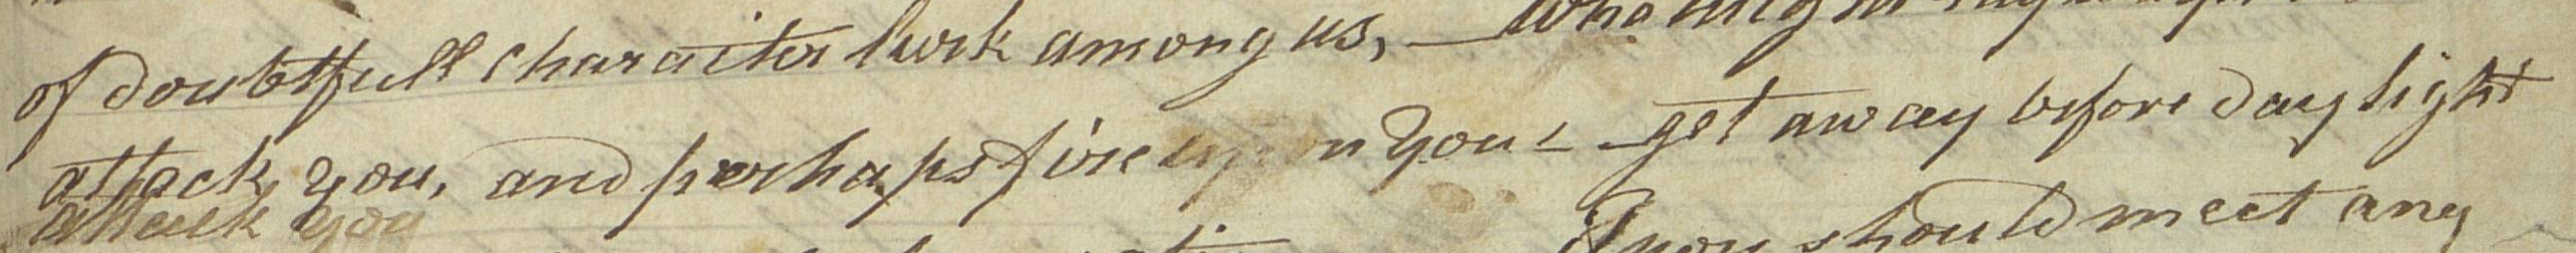attack you, and perhaps fire upon You got away before day light
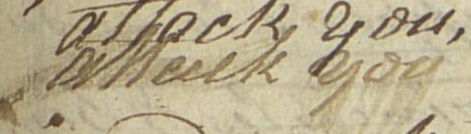attack You
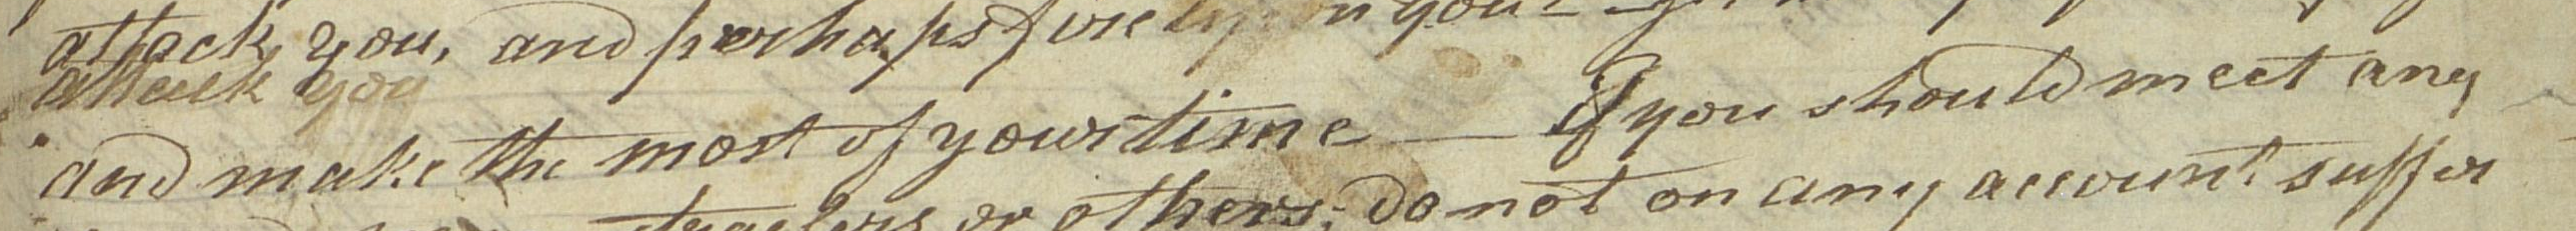and make the most of your time. if you should meet any
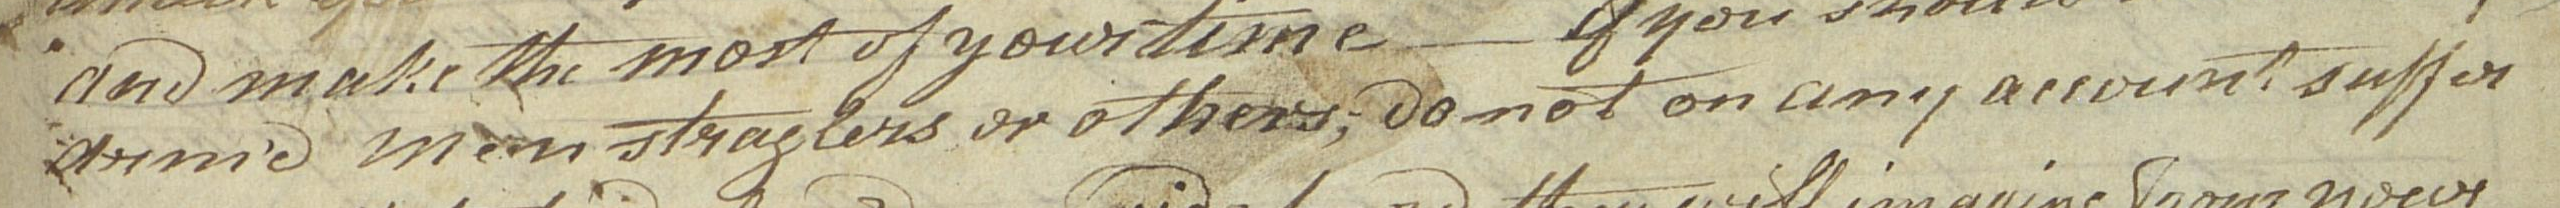arm'd men straglers or others; do not on any account suffer
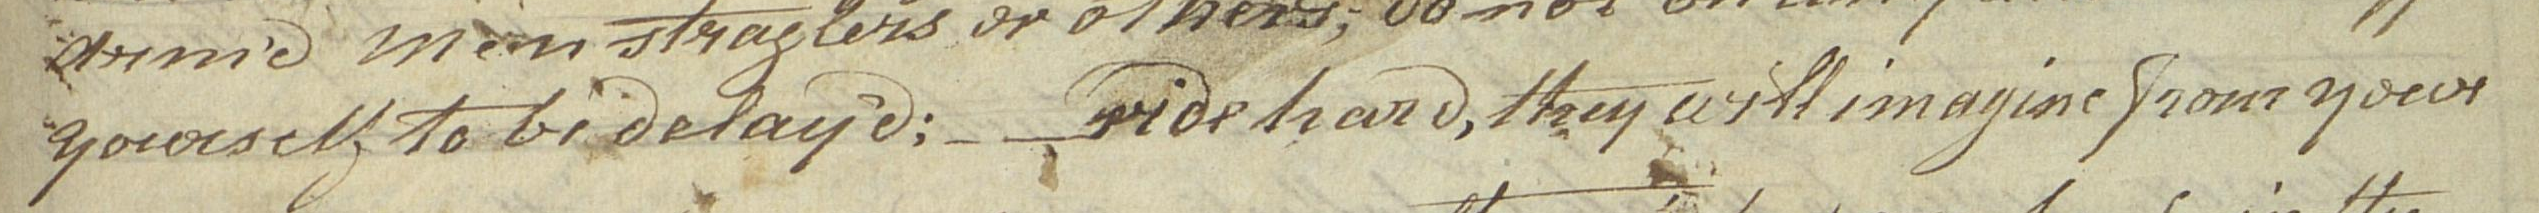yourself to be delay'd; ride hard, they will imagine from your
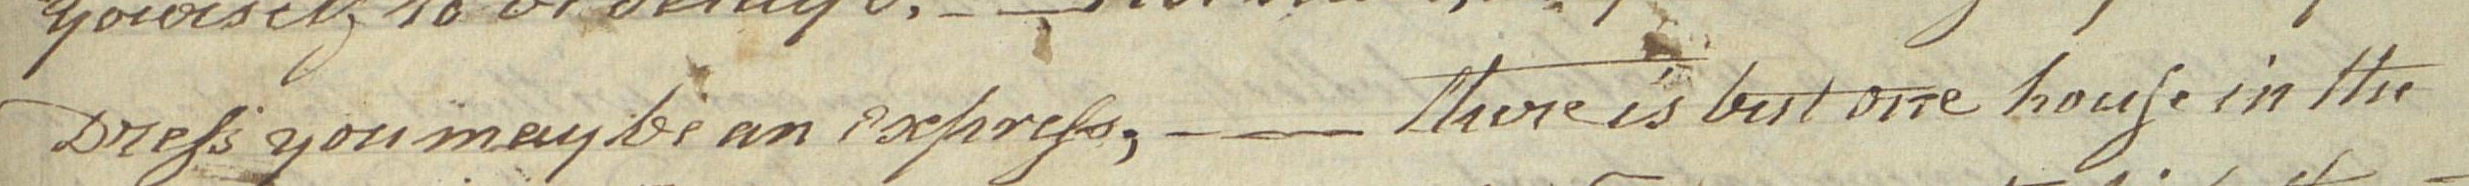Dress you maybe an express, There is but one house in the
